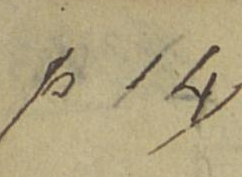p 14
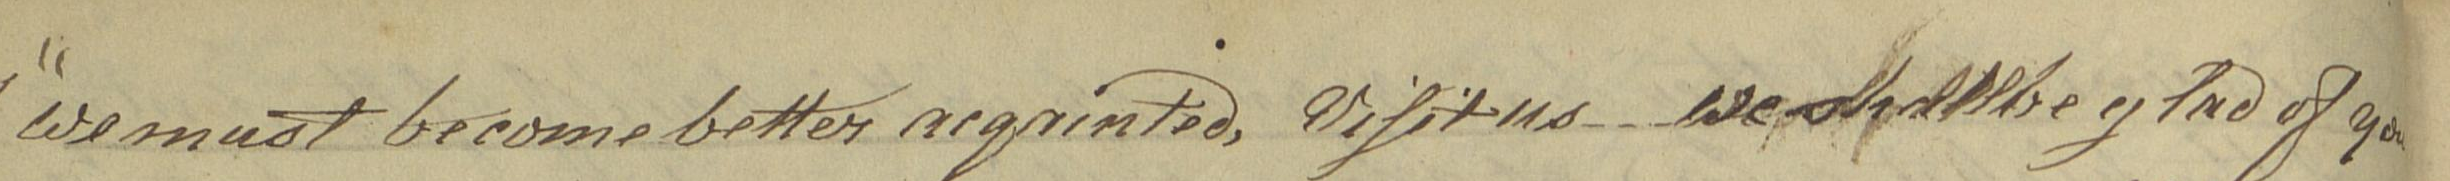"we must be come better acqainted, visit us. We shall be glad of you
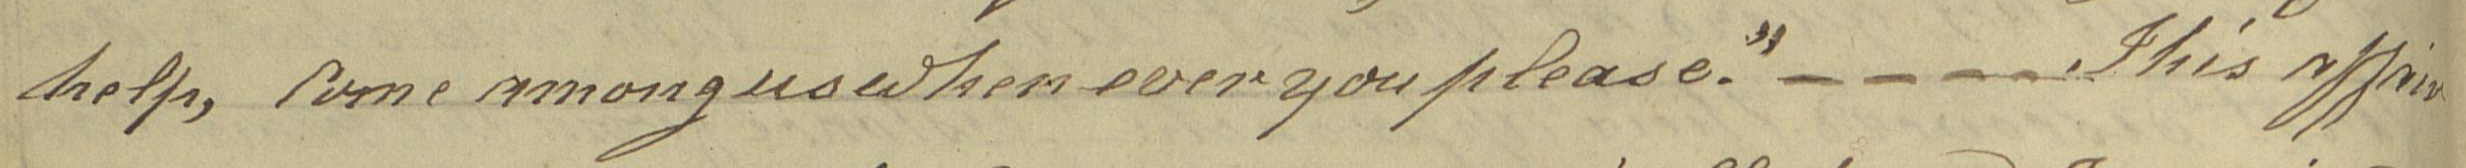help, come among us when ever you please." This Affair
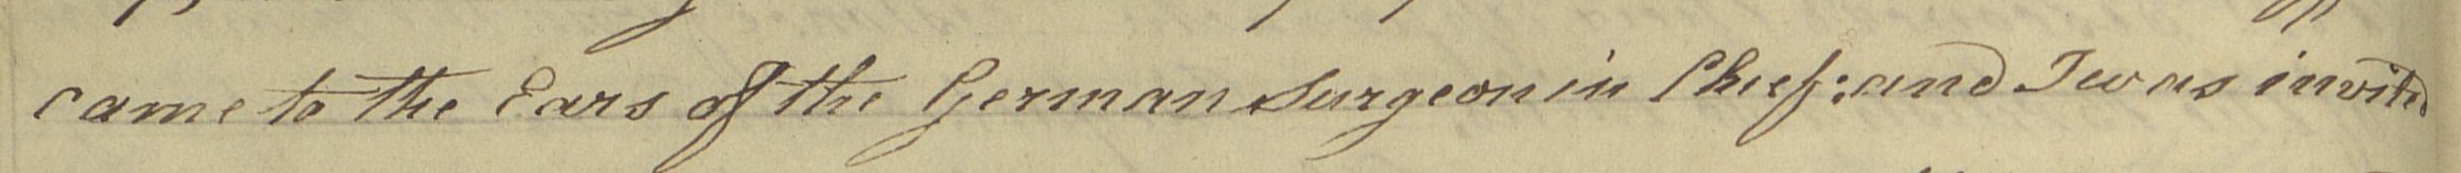came to the Ears of the German Surgeon in Chief: and I was invited
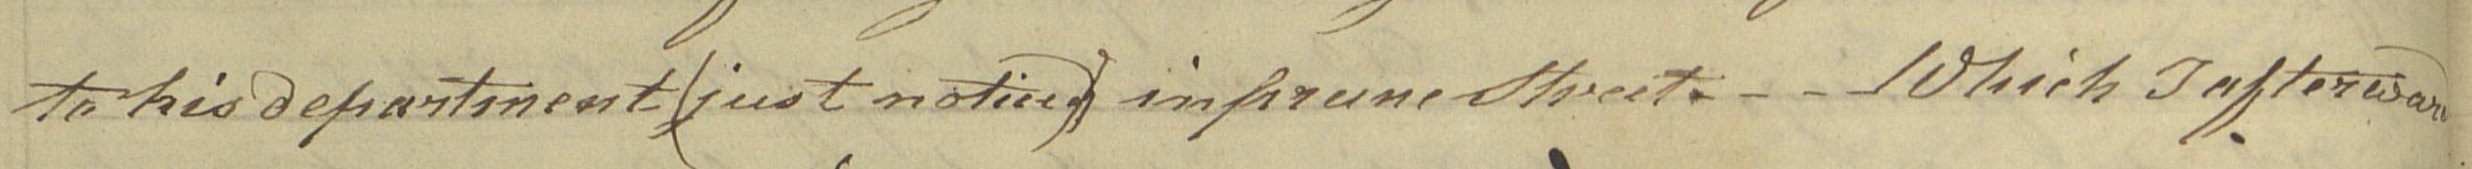to his department (just notice) in prune Street. Which I afterward
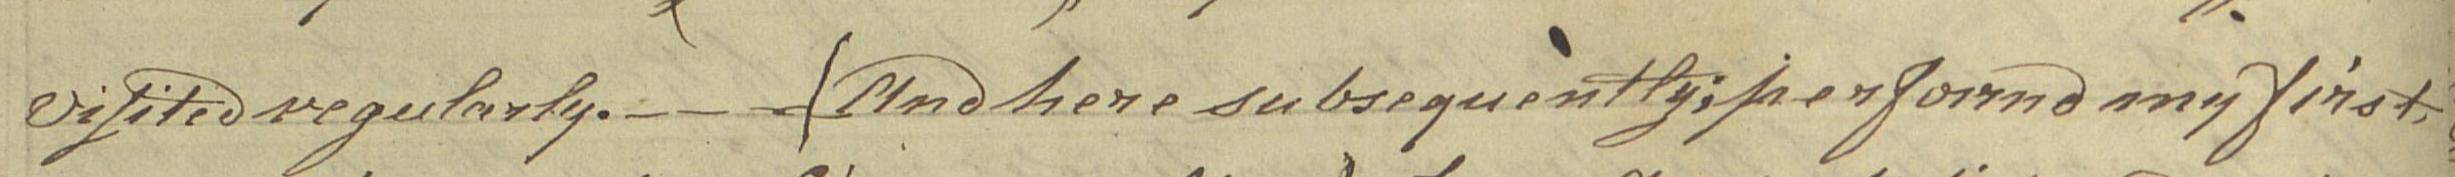visited regularly. (And here subsequently; performd my first
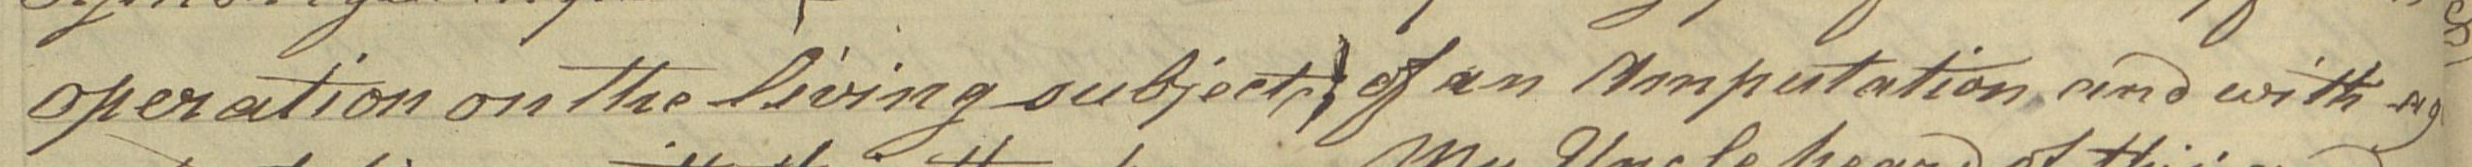operation on the living subject) of an amputation and with my
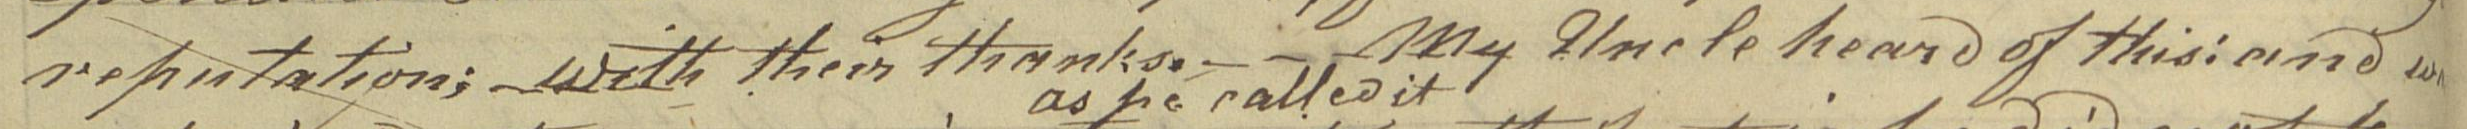reputation; with their thanks. My Uncle heard of this: and is
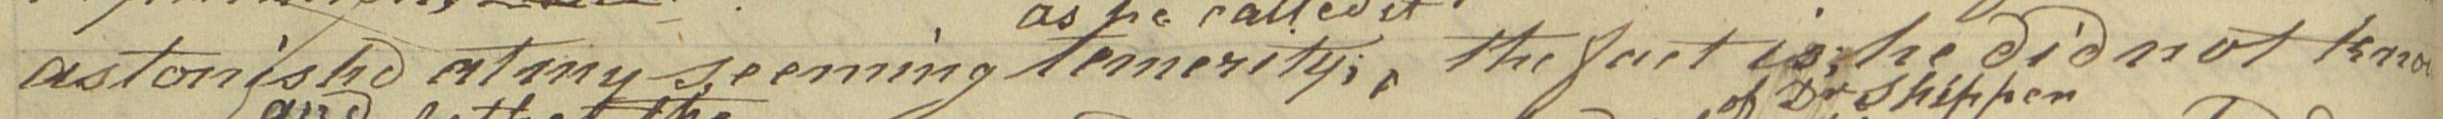astonishd at my seeming temerity, ^ the fact is he did not know
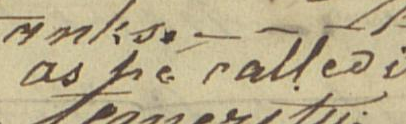as he called it
